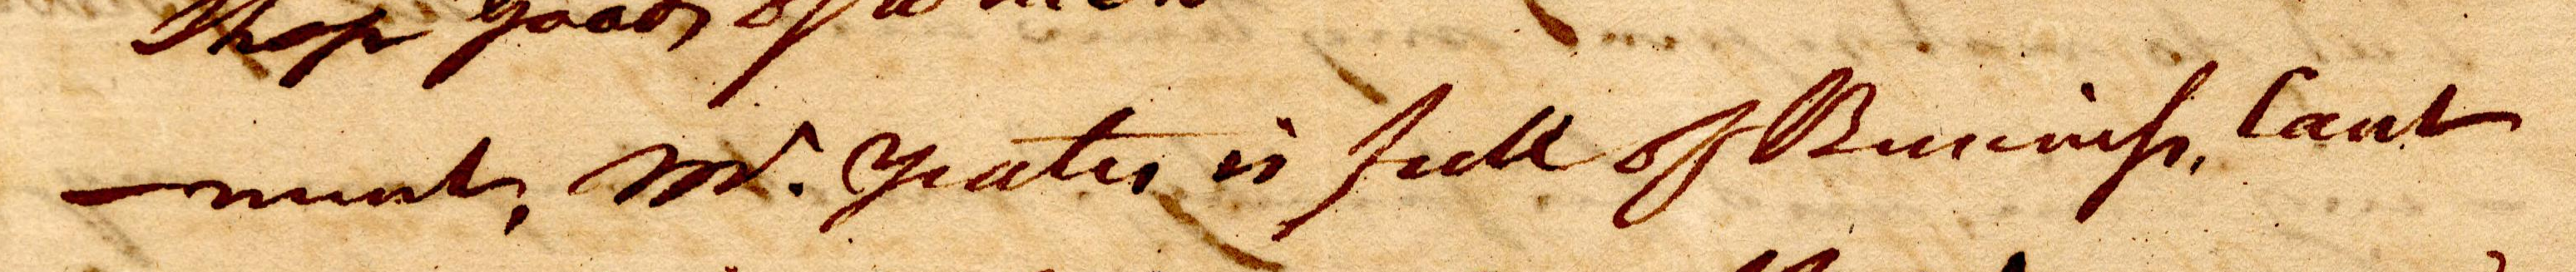-ment, M^r. Yeates is full of business, Cant
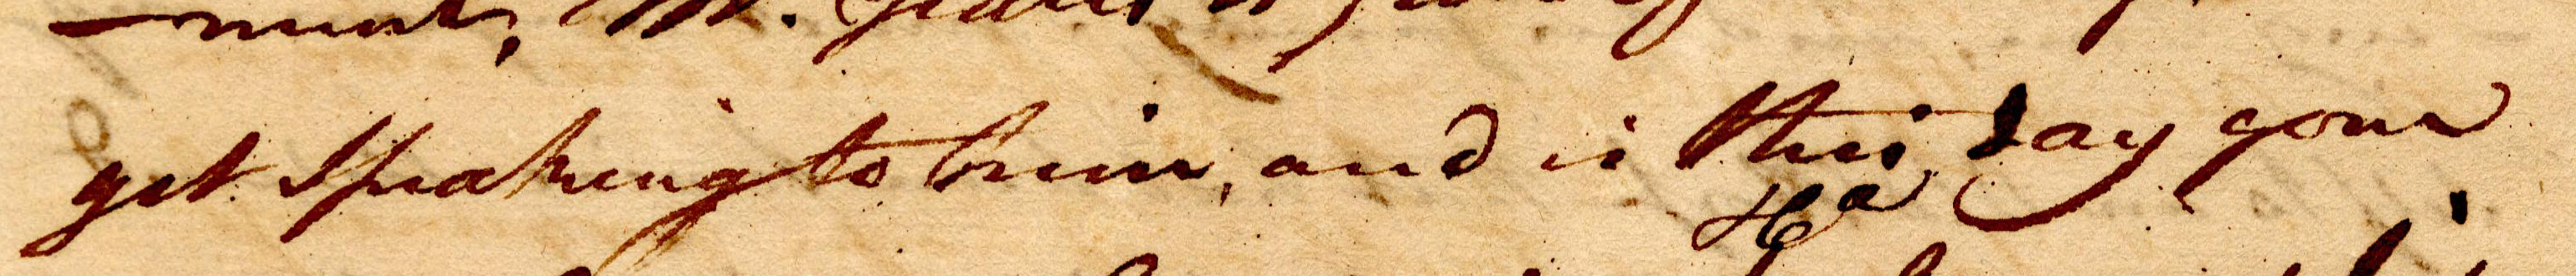get speaking to him, and is this day gone
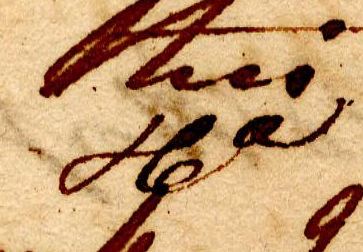&c^a
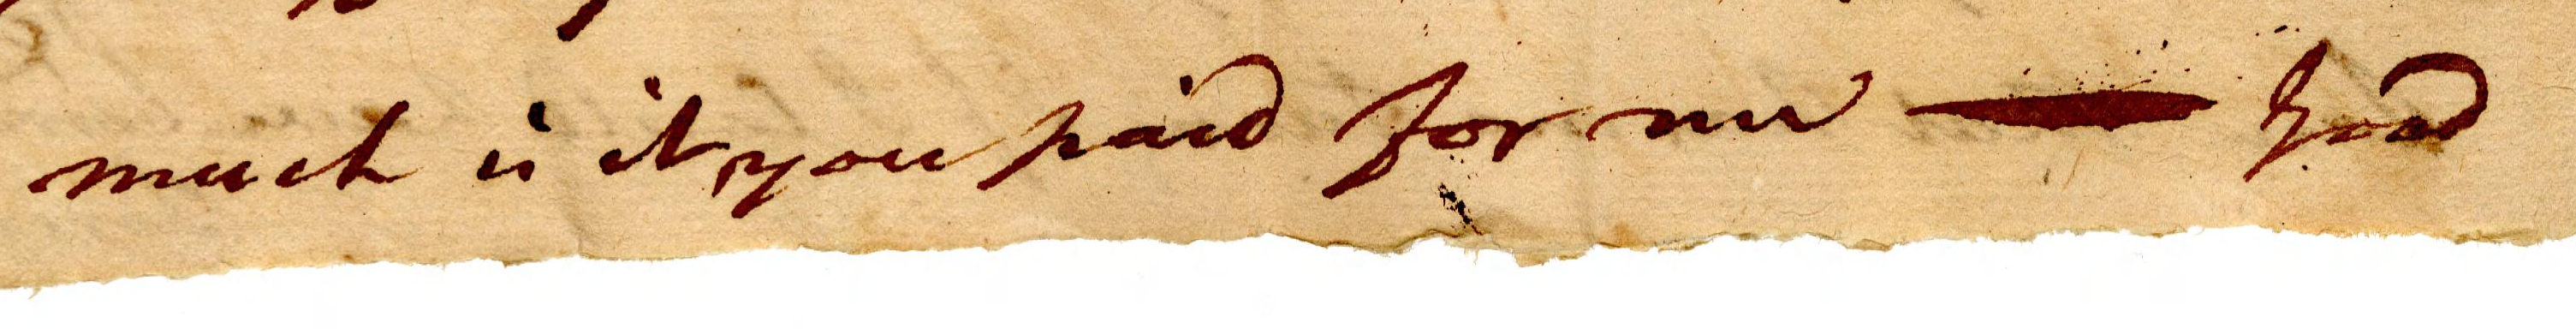much is it you paid me- Good
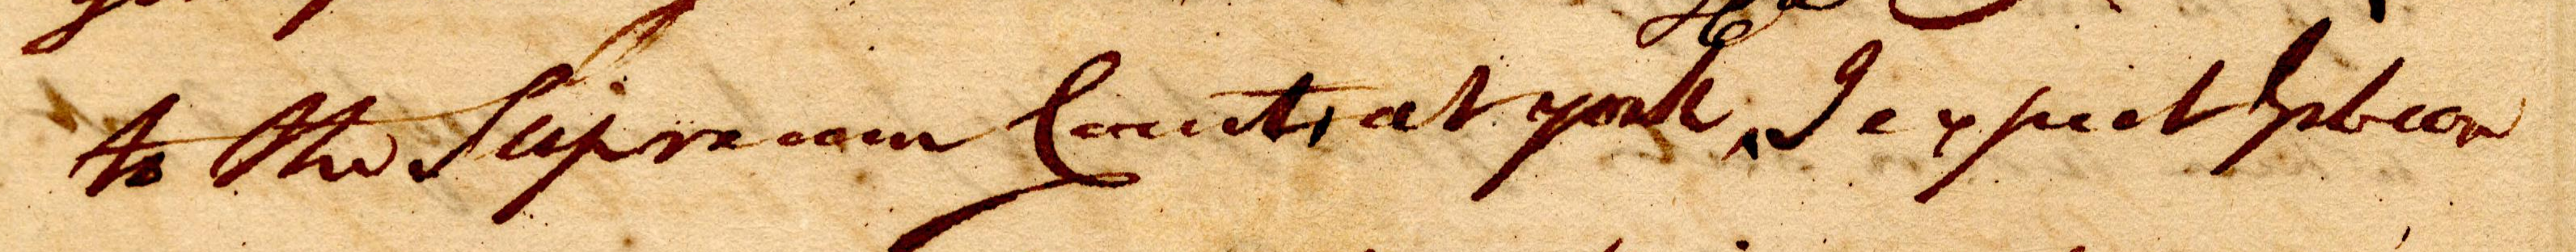to the Supreme Court at York, I expect Gibcon
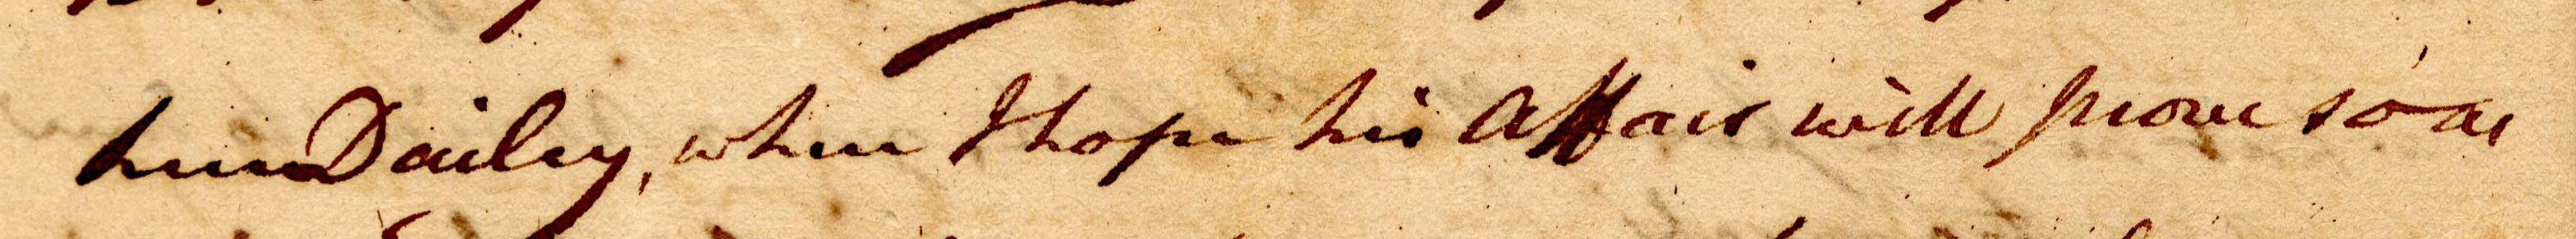him Dailey, when & hope his Affair will prove so as
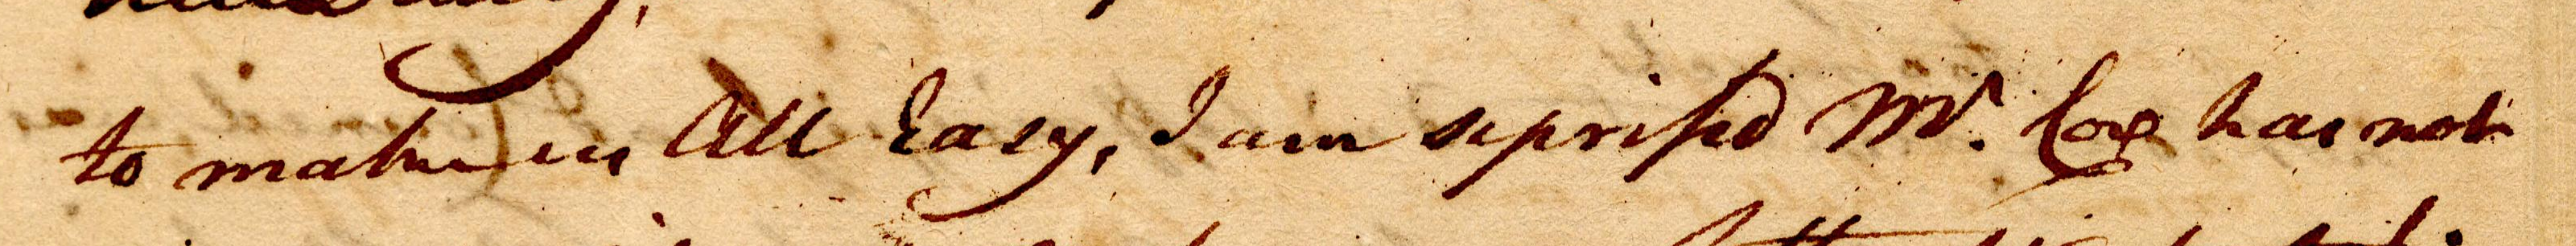to make us All Easy, I am suprised M^r. Cox has not
